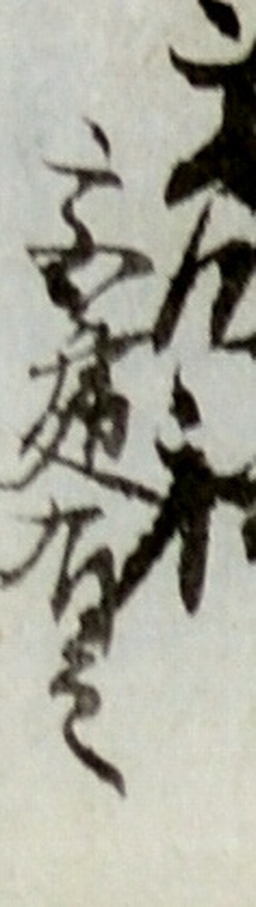宮建有之

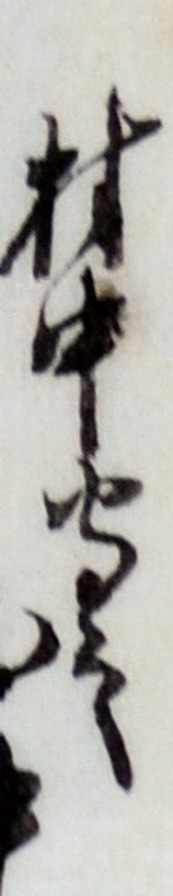村中守之
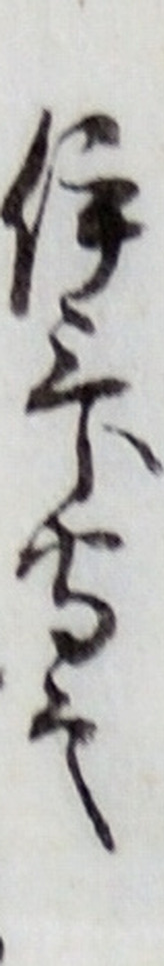伊三郎守之
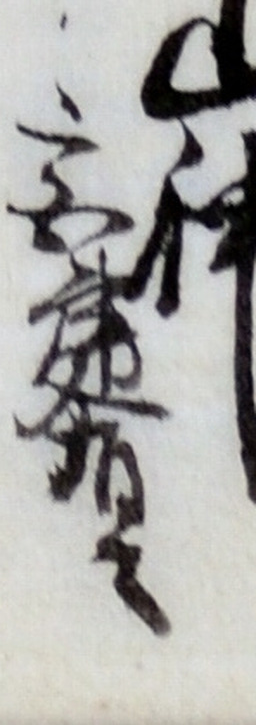宮建有之
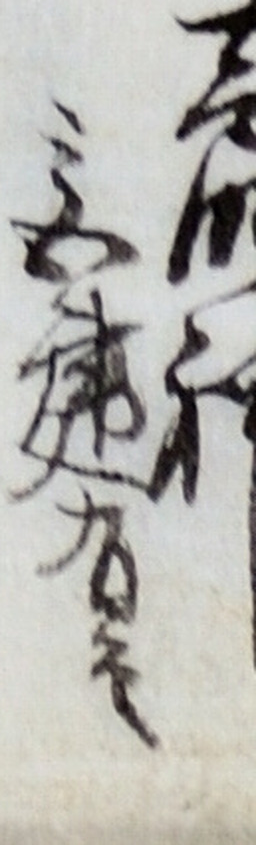宮建有之
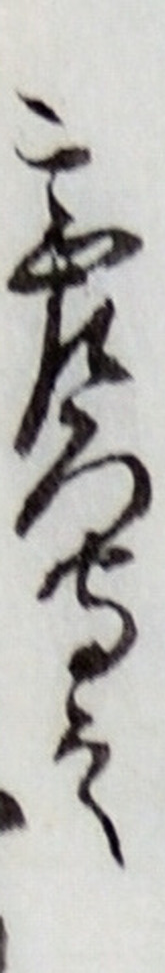甚左衛門守之
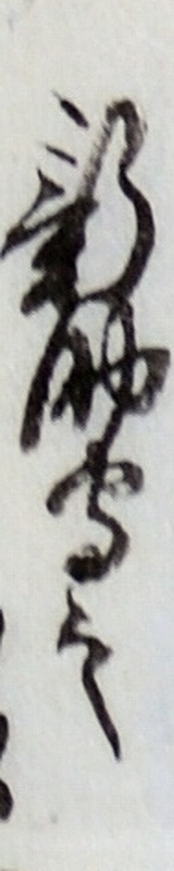新助守之
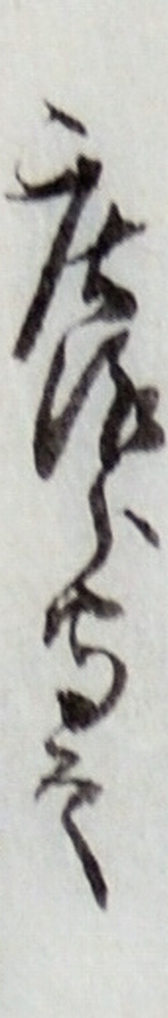庄治郎守之
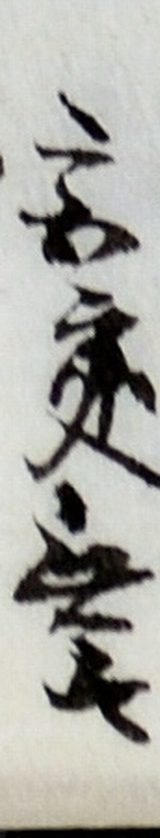宮建無之
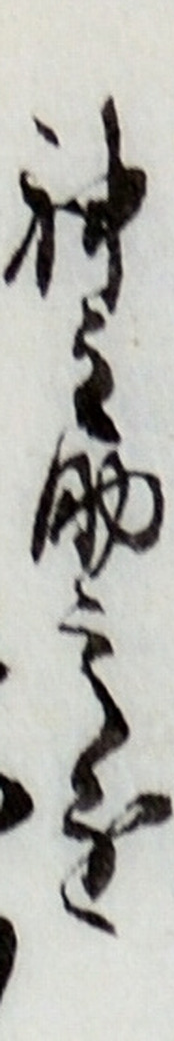神主助之進
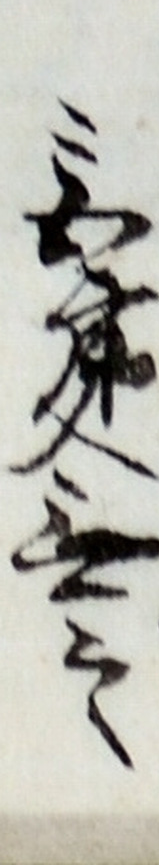宮建無之
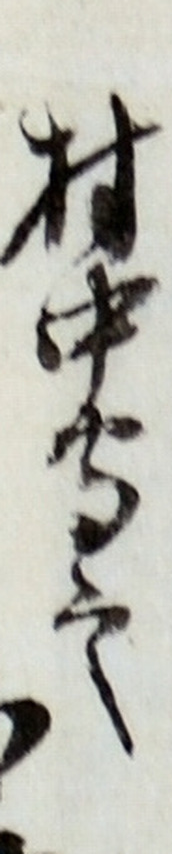村中守之
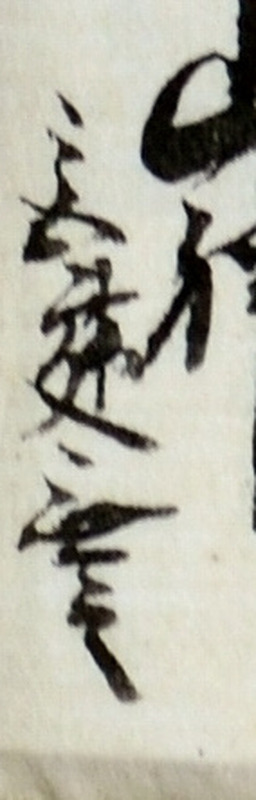宮建無之
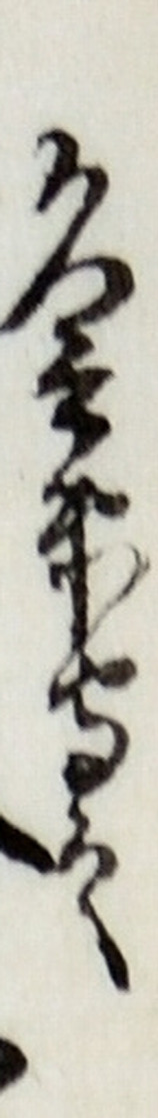久兵衛守之
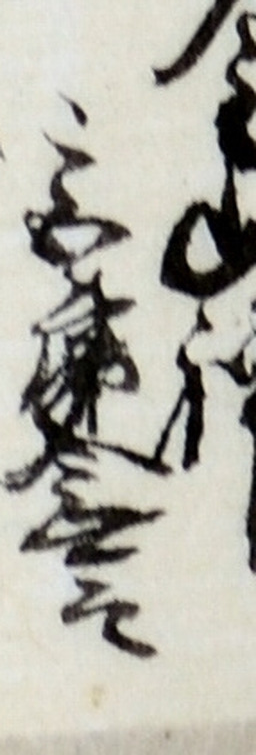宮建無之
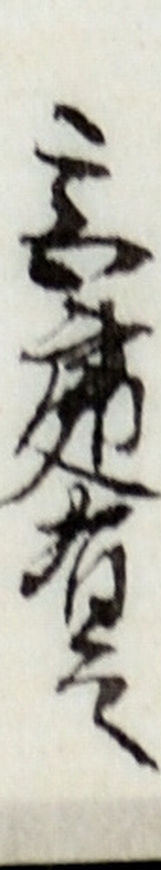宮建有之
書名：御領分中山林社地手控
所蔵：伊那市立高遠町図書館・合同会社AMANE
